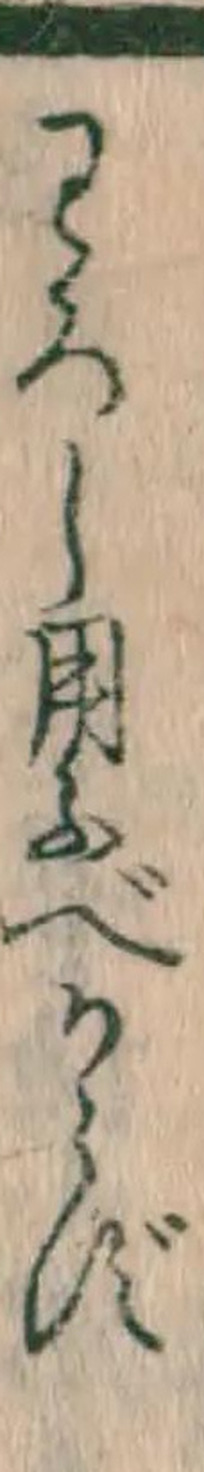わろし用ふべからず
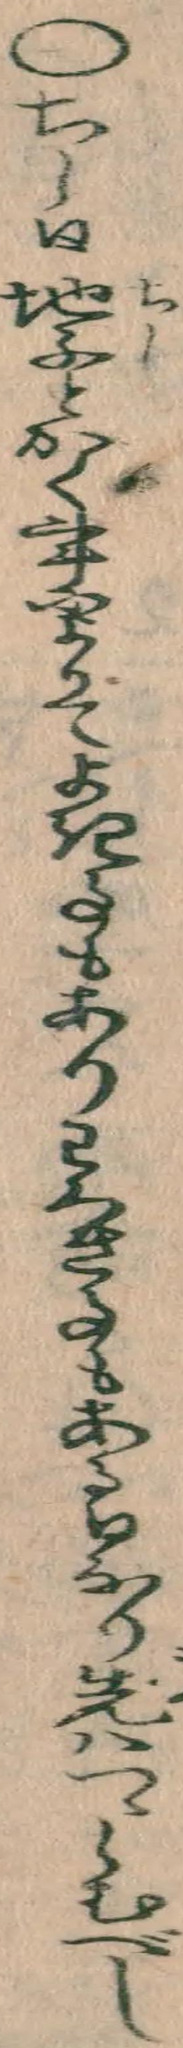○ちし日地子とかく事によりてよき事もありわろき事もある日なり先はつゝしむべし
